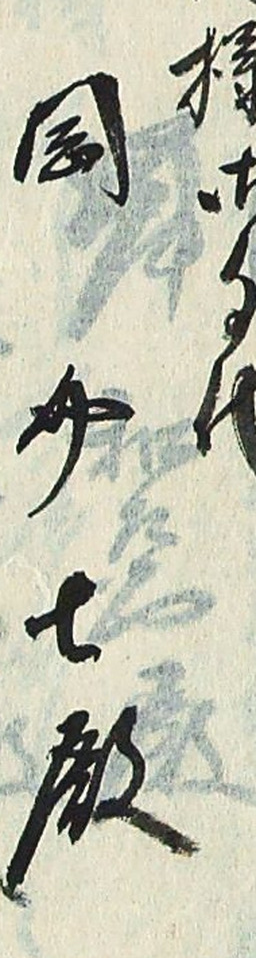岡介七殿
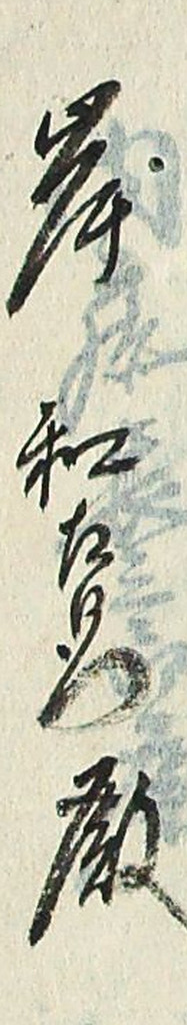岸和左衛門殿

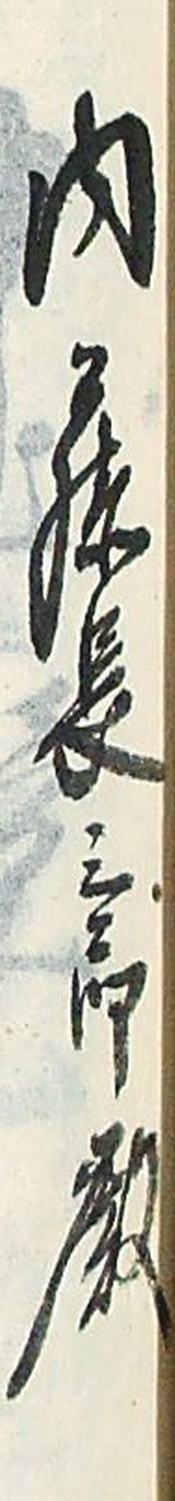内藤長三郎殿
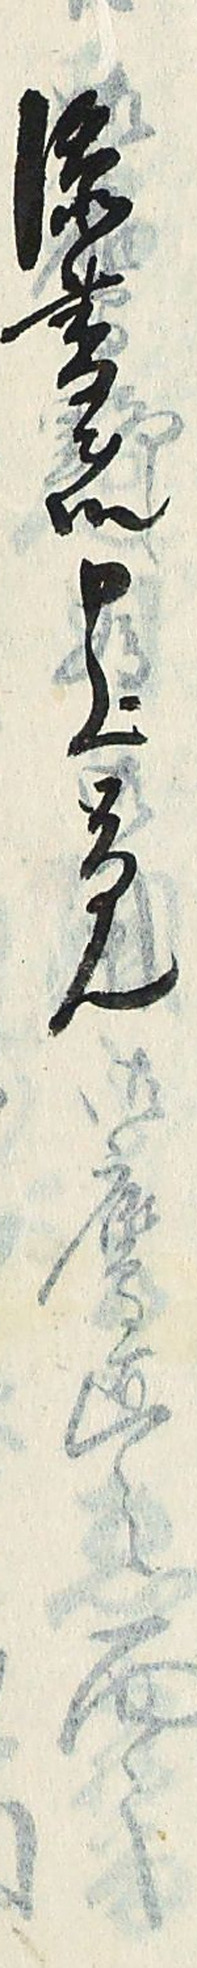添書を以申上覚
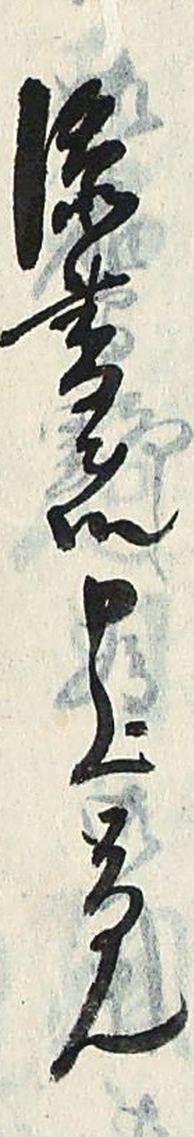添書を以申上覚
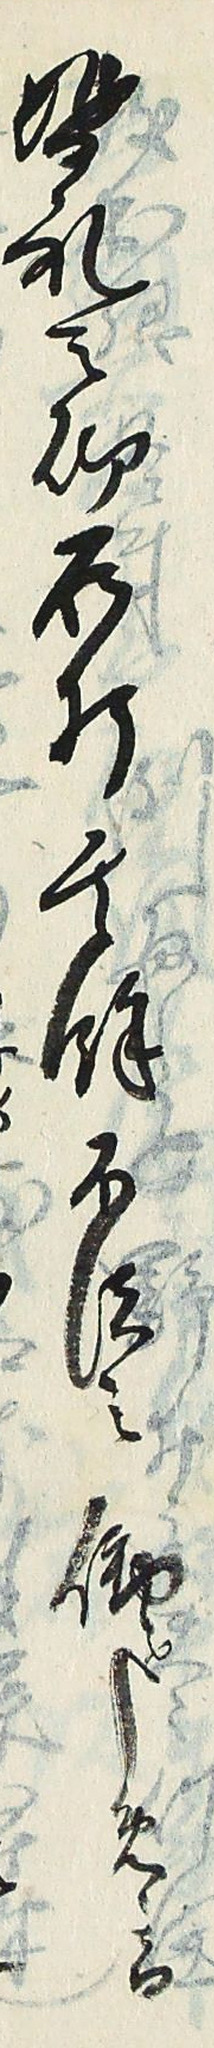婚礼之砌石打其余不法之働せしめ候者
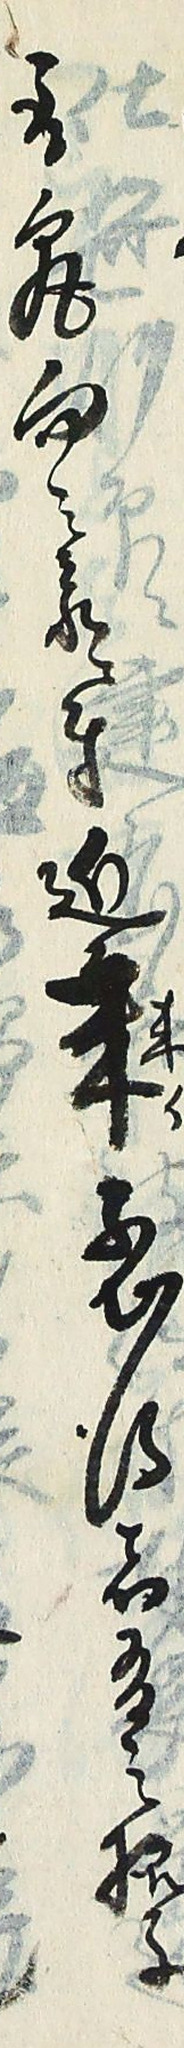取究向之義に付近来不心得者有之様子
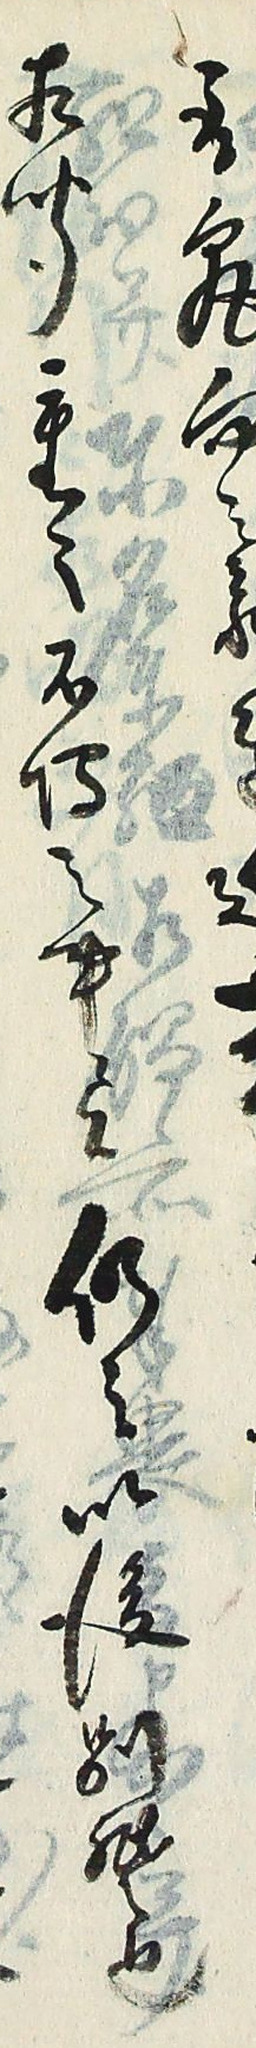相聞重々不埒之事に候仍之以後別紙之通
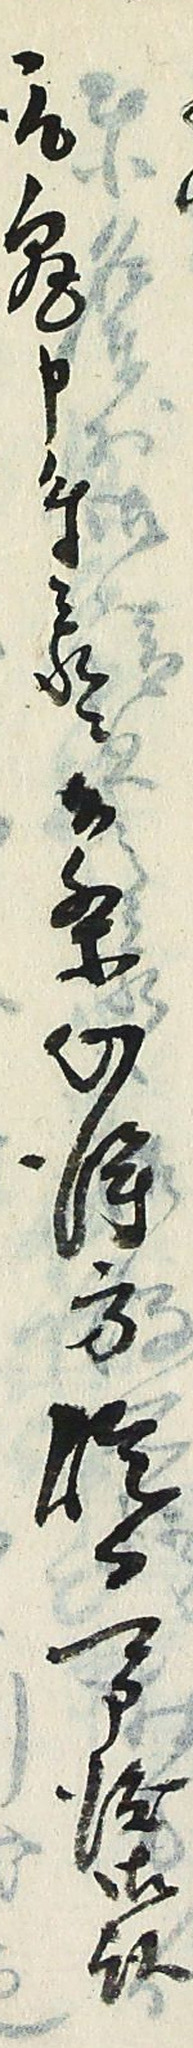取究申付義に候条心得方屹と可申渡御趣
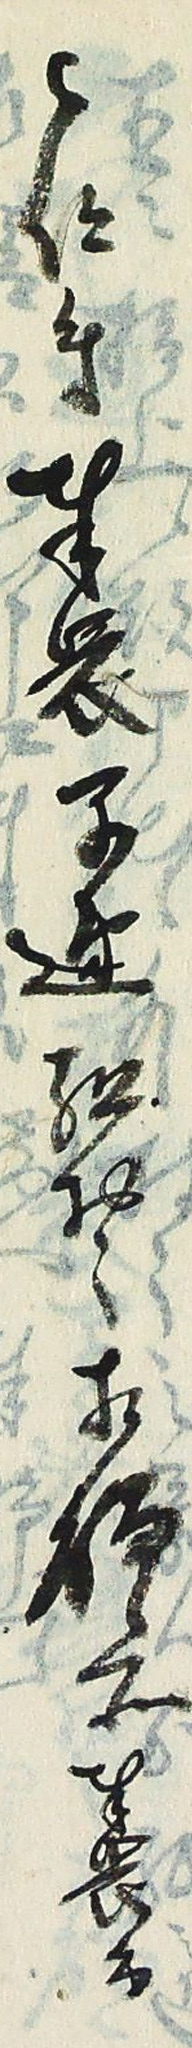被仰付奉畏早速組村々相触候所奉畏旨
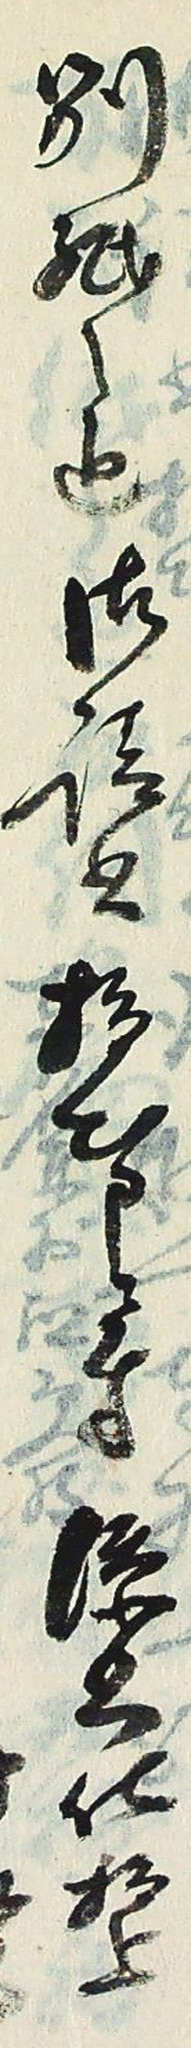別紙之通御請書指出申に付添書仕指上
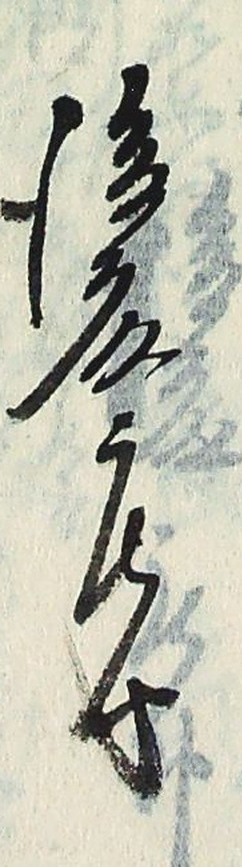後藤庄助
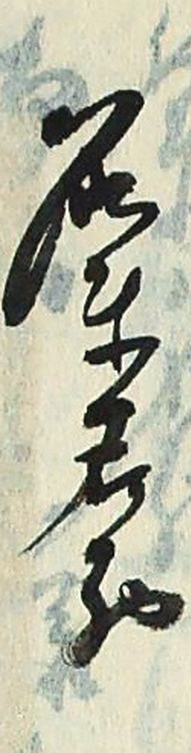名東名西
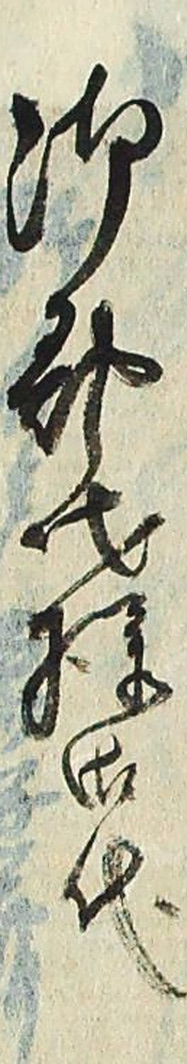御郡代様御手代
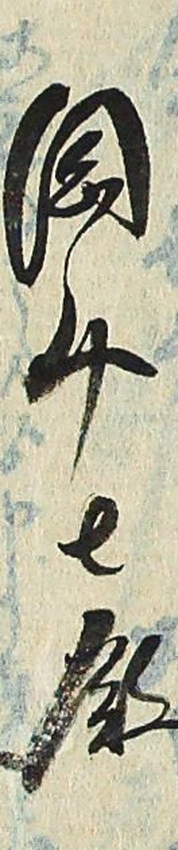岡介七殿
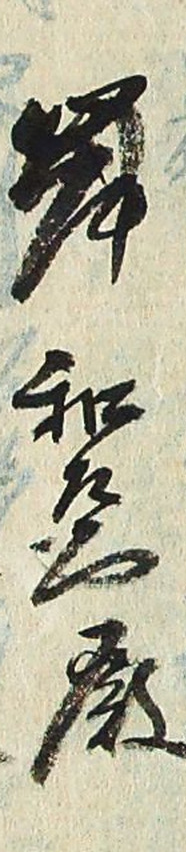岸和左衛門殿
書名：諸御用御□受書控
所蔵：鳴門教育大学 Naruto University of Education
